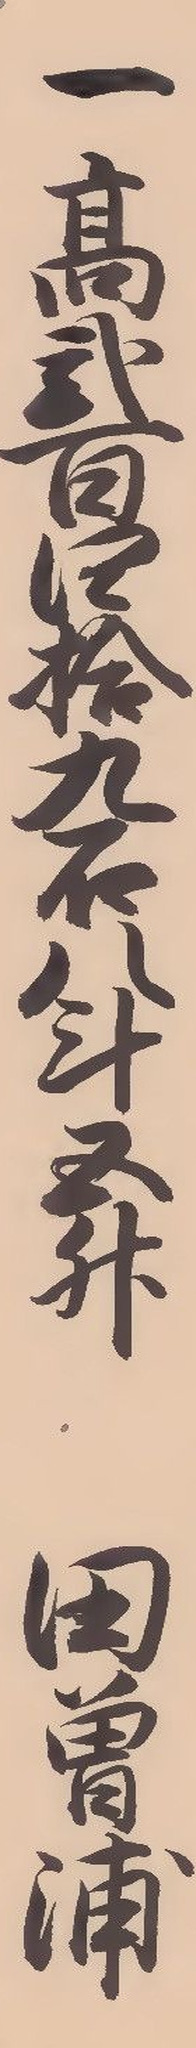一高弐百四拾九石八斗五升田曽浦
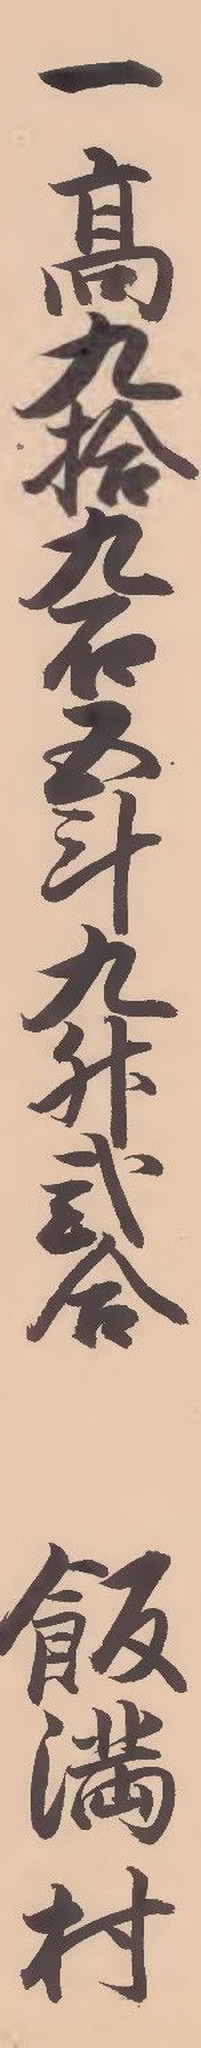一高九拾九石五斗九升弐合飯満村
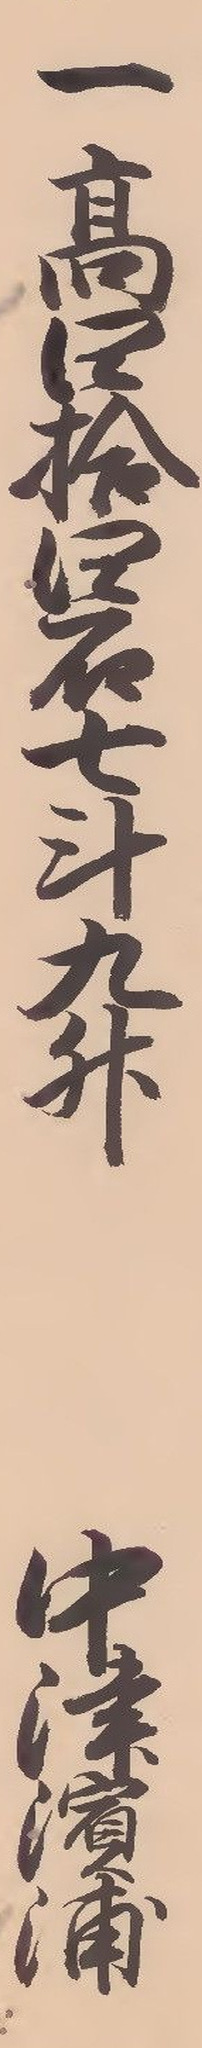一高四拾四石七斗九升中津浜浦

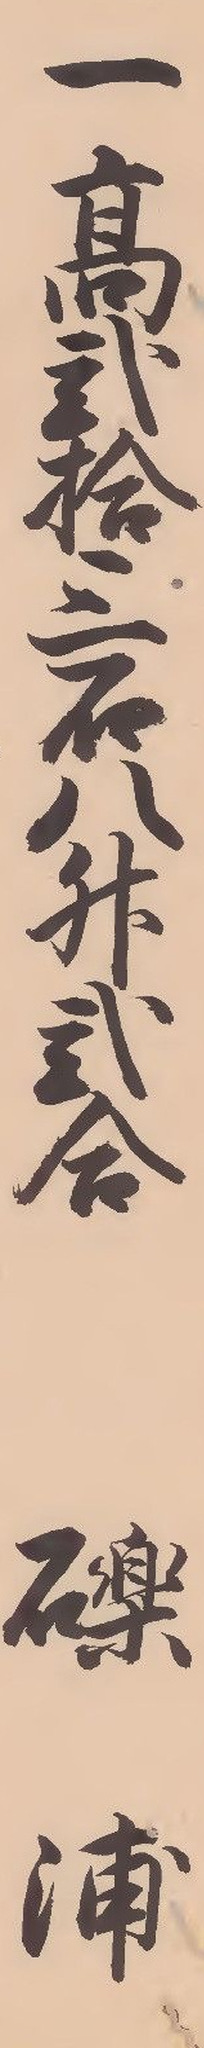一高弐拾三石八升弐合礫浦
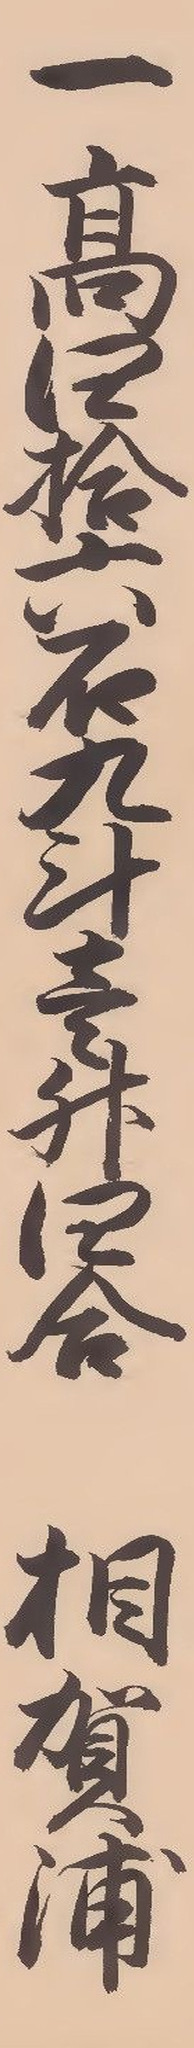一高四拾六石九斗壱升四合相賀浦
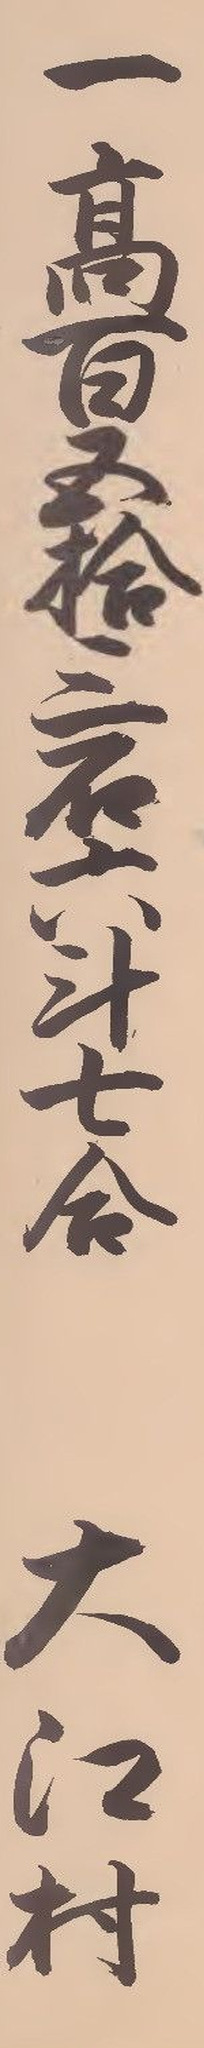一高百五拾三石六斗七合大江村
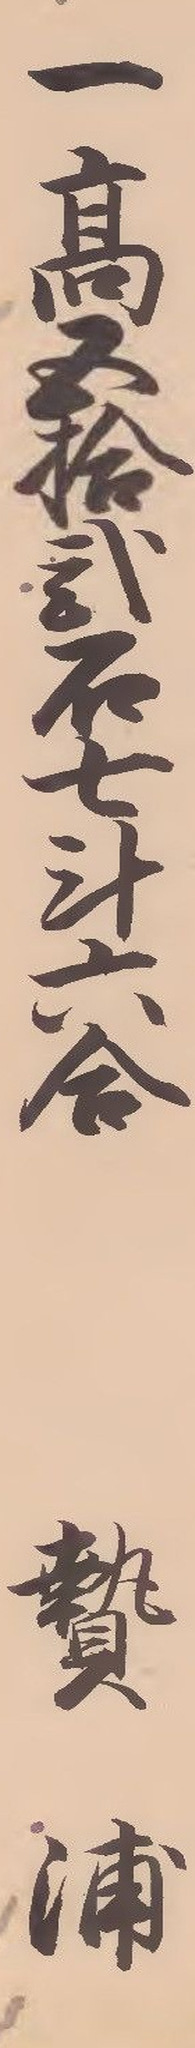一高五拾弐石七斗六合贄浦

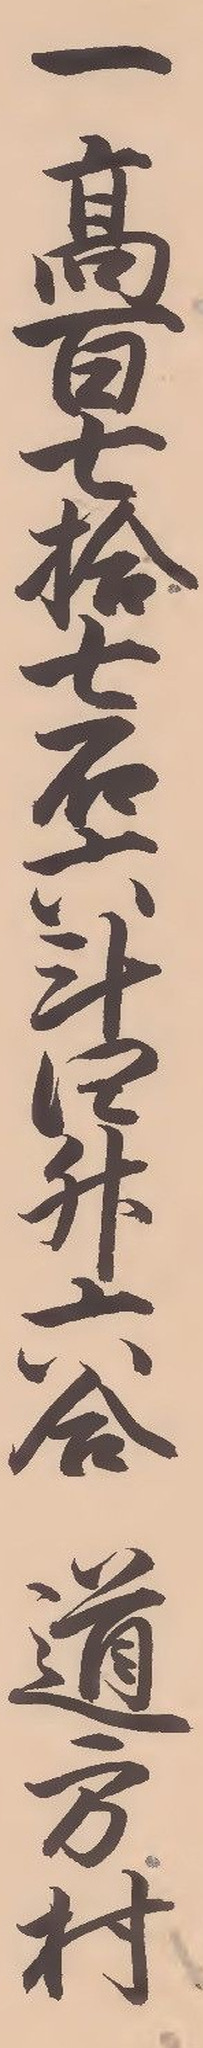一高百七拾七石六斗四升六合道方村
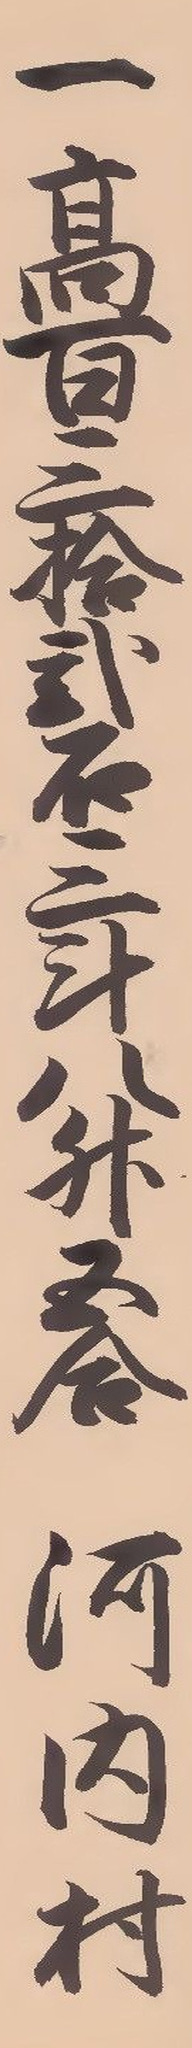一高百三拾弐石三斗八升五合河内村
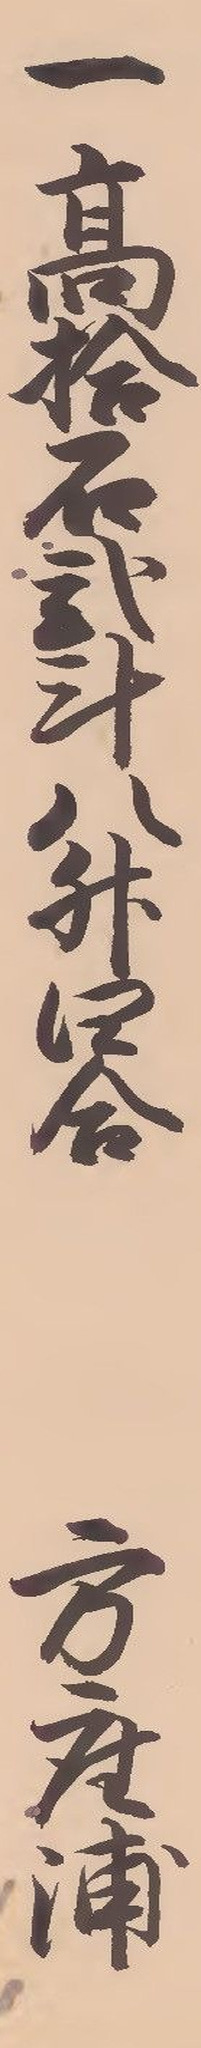一高拾石弐斗八升四合方座浦

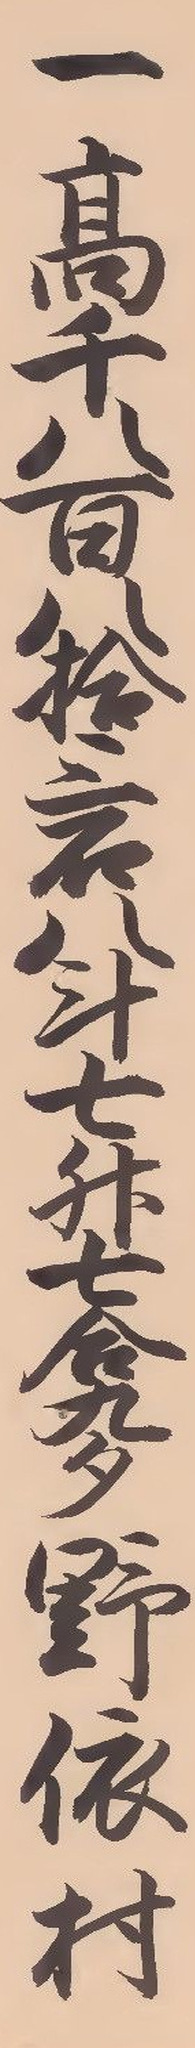一高千八百八拾三石八斗七升七合九勺野依村
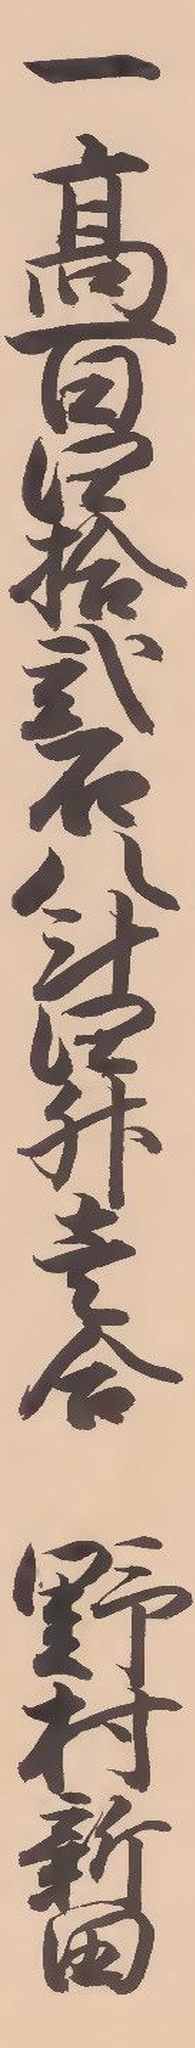一高百四拾弐石八斗四升壱合野村新田

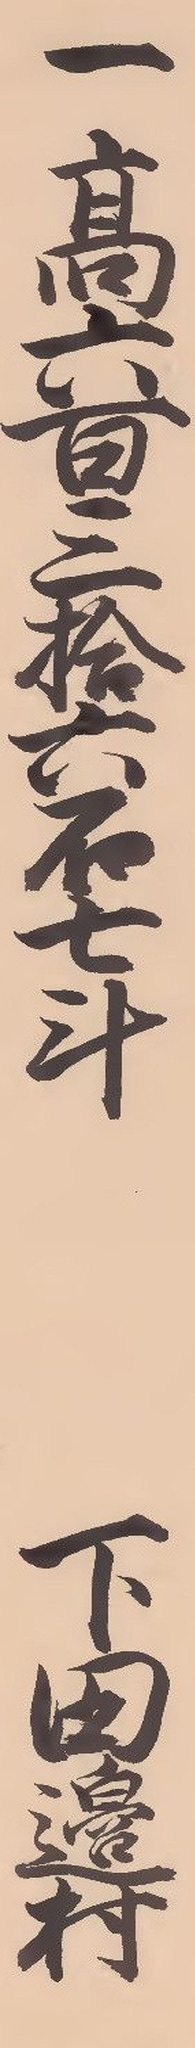一高六百三拾六石七斗下田辺村
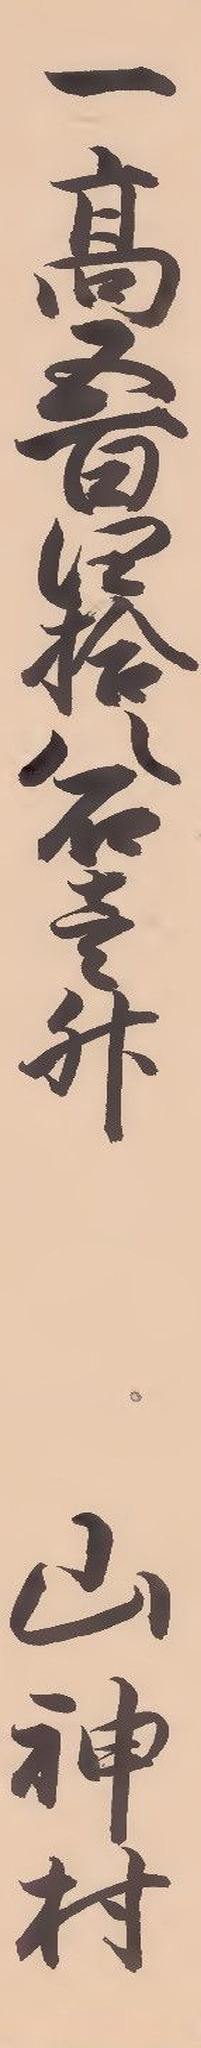一高五百四拾八石壱升山神村
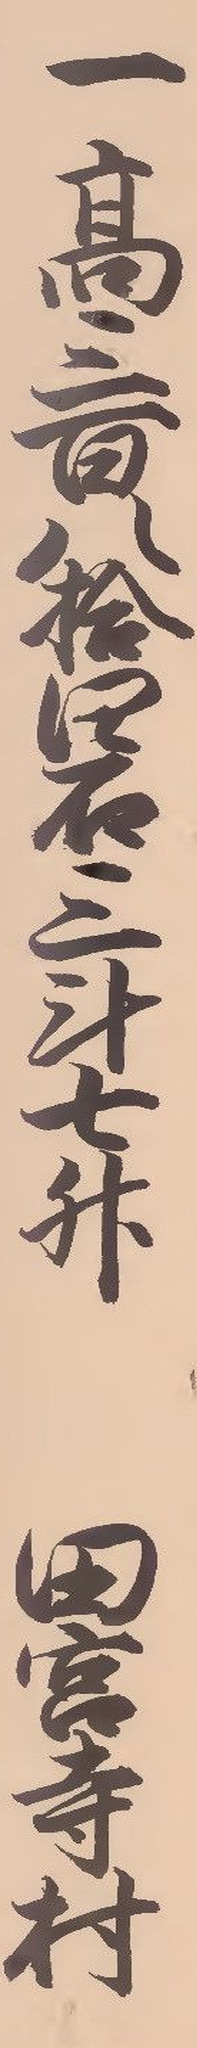一高三百八拾四石三斗七升田宮寺村
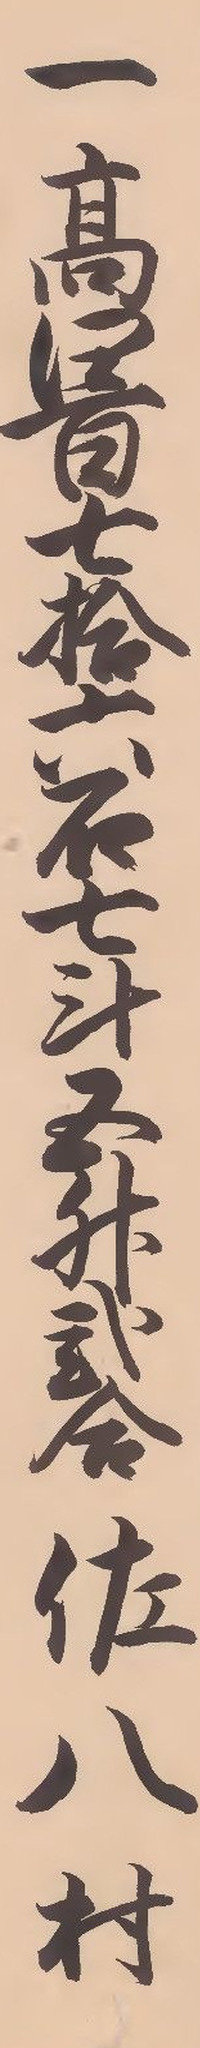一高四百七拾六石七斗五升弐合佐八村
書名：伊勢国郷帳
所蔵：国立公文書館 National Archives of Japan
